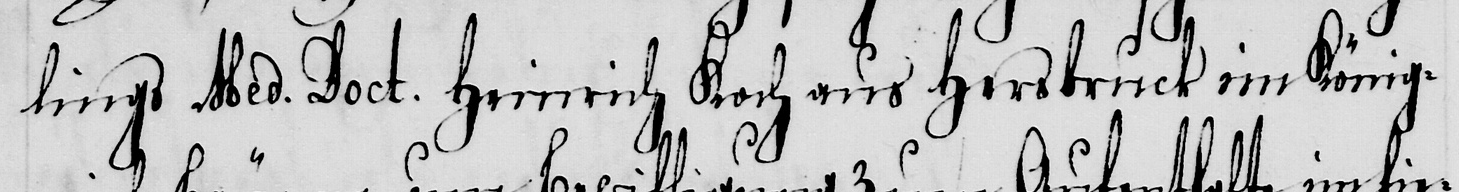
lings Med. Doct. Heinrich Koch aus Hersbruck im König¬
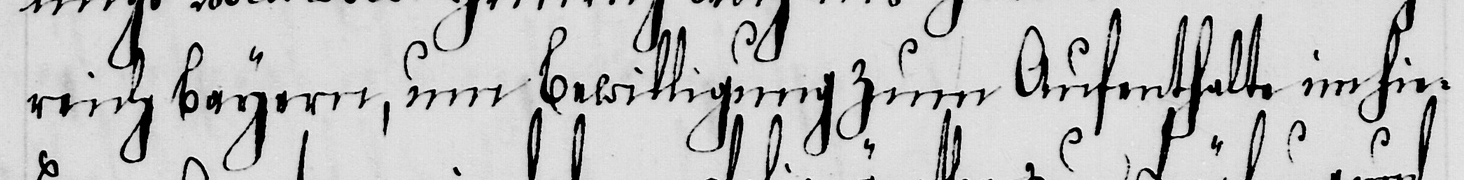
reich Bayern, um Bewilligung zum Aufenthalte in hie¬
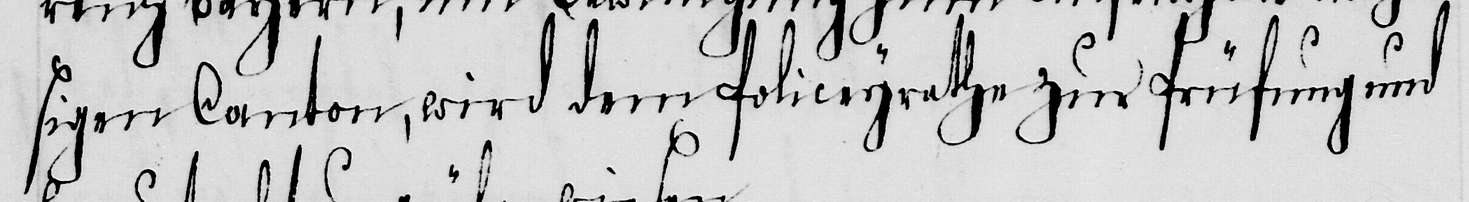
sigen Canton, wird dem Policeyrathe zur Prüfung und
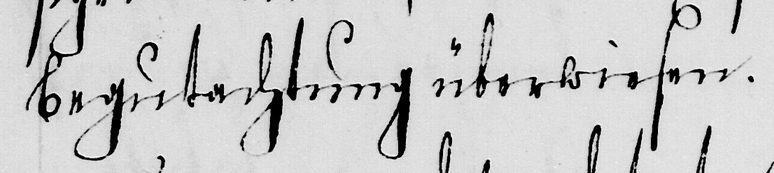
Begutachtung überwiesen.
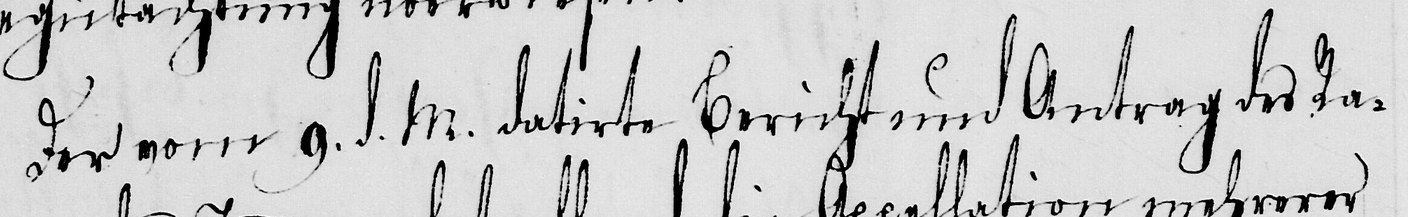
Der vom 9. d. M. datirte Bericht und Antrag des Ra¬
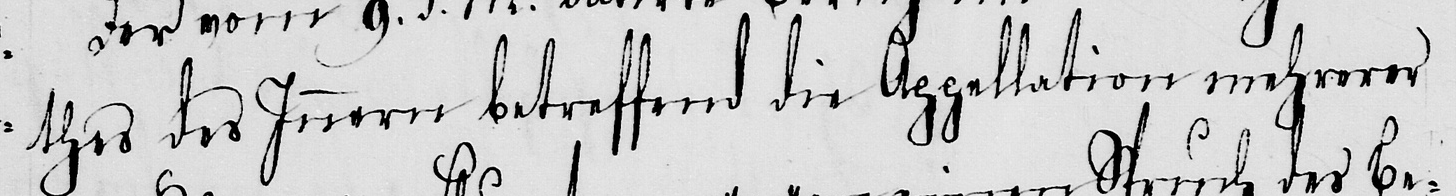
thes des Innern betreffend die Appellation mehrerer
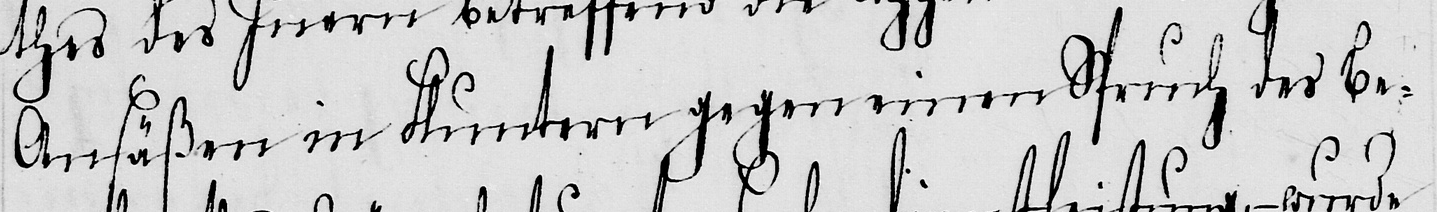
Ansäßen in Fluntern gegen einen Spruch des Be¬
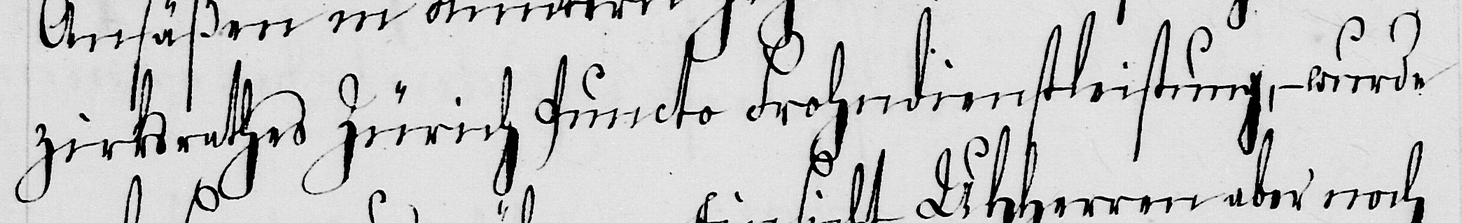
zirksrathes Zürich Puncto Frohndienstleistung, – wur¬
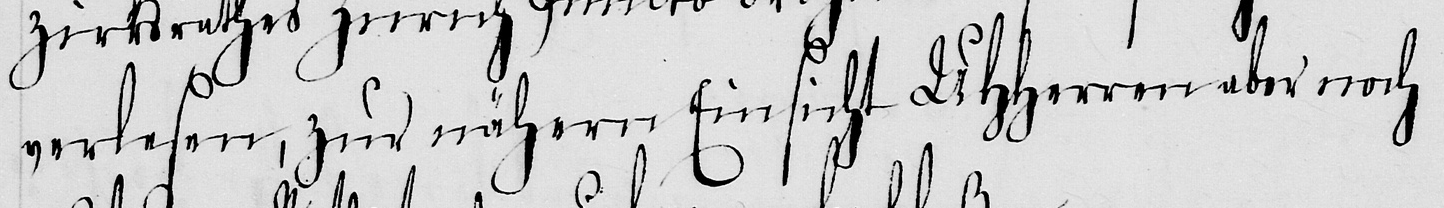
verlesen, zur nähern Einsicht UHHerren aber noch
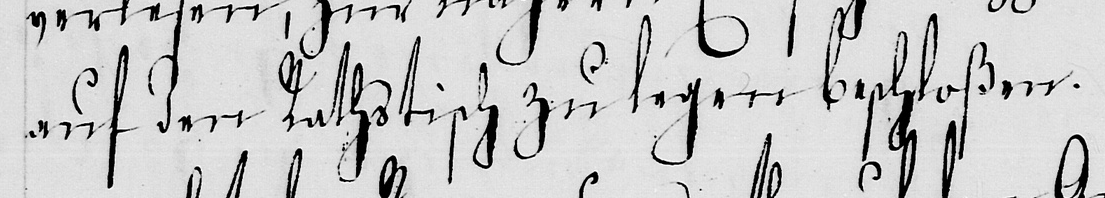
auf den Rathstisch zu legen beschloßen.
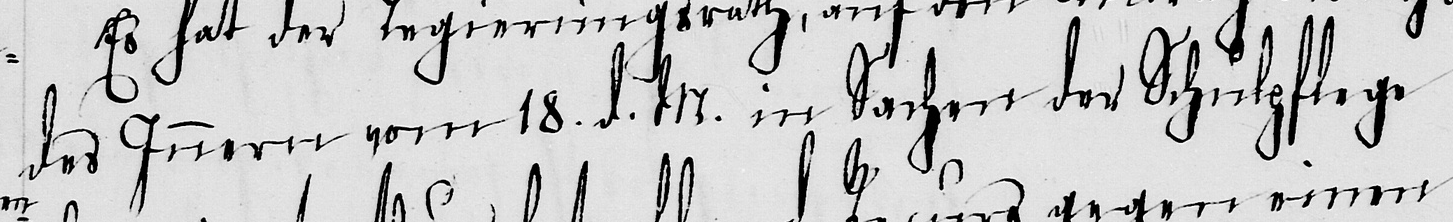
des Innern vom 18. d. M. in Sachen der Schulpflege
